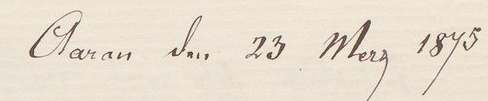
Aarau den 23 Merz 1875
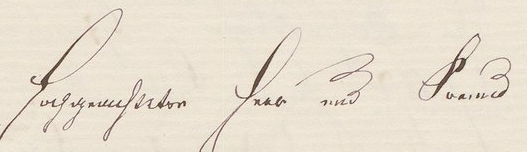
Hochgeachteter Herr und
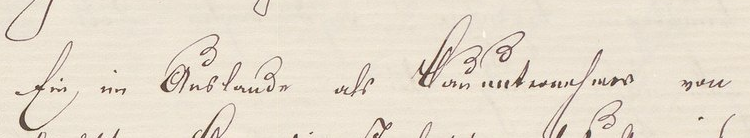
Ein im Auslande als Bauunternehmer von
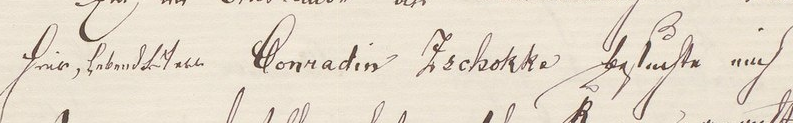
hier, bekannter HerrConradin Zschokke besuchte mich
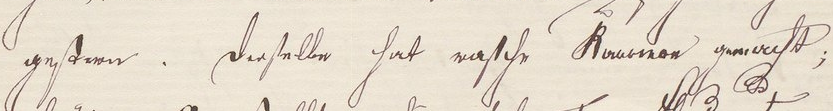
gestern. Derselbe hat rasche Karriere gemacht;
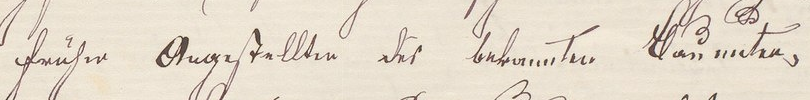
früher Angestellter des bekannten Bauunter-
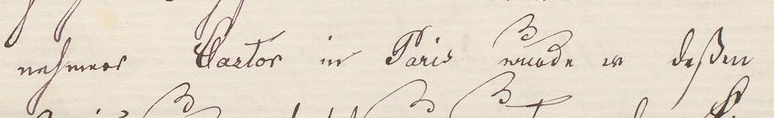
nehmers Castor in Paris wurde er deßen
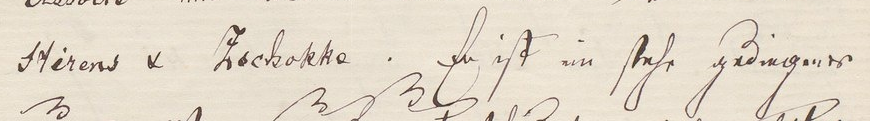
Hirens & Zschokke. Er ist ein sehr gediegener
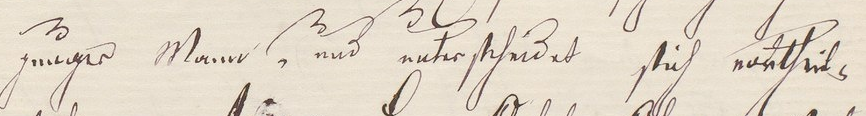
junger Mann, und unterscheidet sich vortheil-
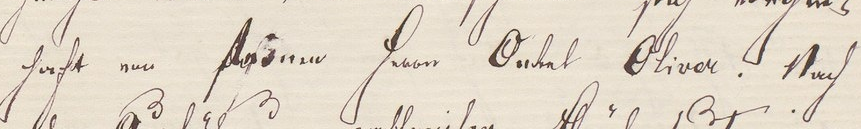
haft von seinem Herrn Onkel Oliver. Nach
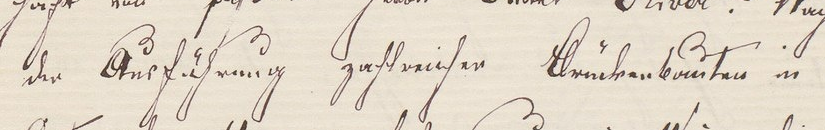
der Ausführung zahlreicher Brückenbauten in
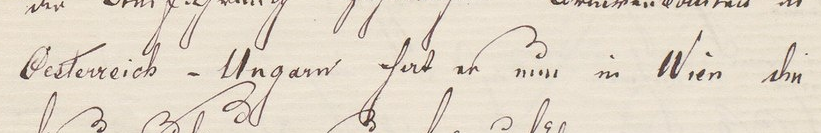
Oesterreich – Ungarn hat er nun in Wien die
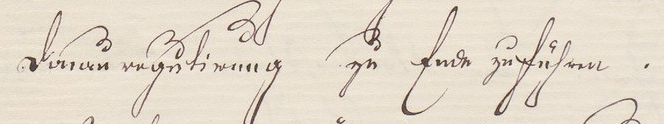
Donauregulirung zu Ende zu führen.
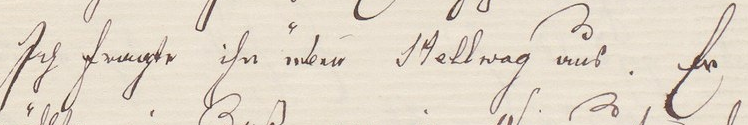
Ich fragte ihn über Hellwag aus. Er
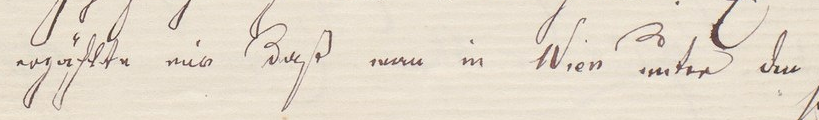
erzählte mir daß man in Wien unter den
